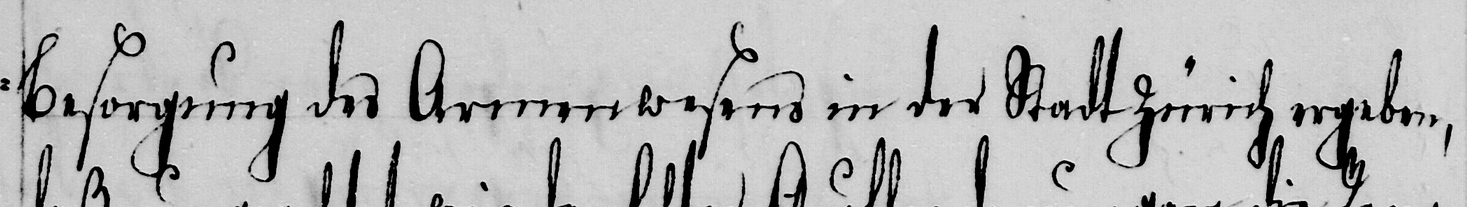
Besorgung des Armenwesens in der Stadt Zürich ergeben,
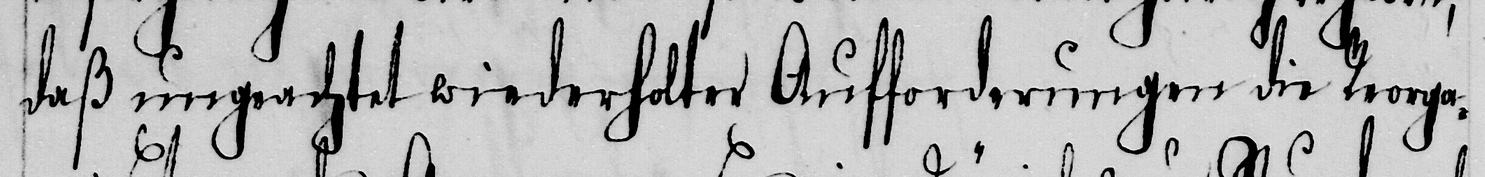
daß ungeachtet wiederholter Aufforderungen die Reorga¬
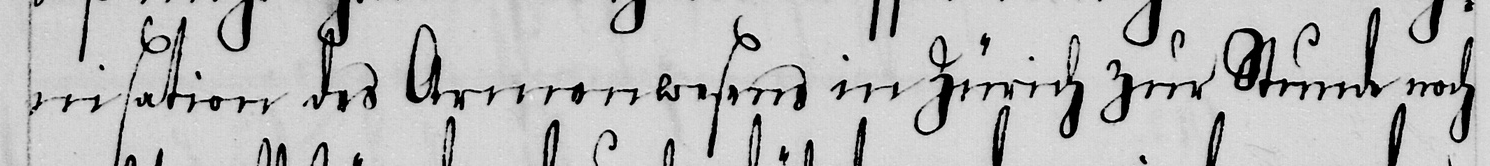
nisation des Armenwesens in Zürich zur Stunde noch
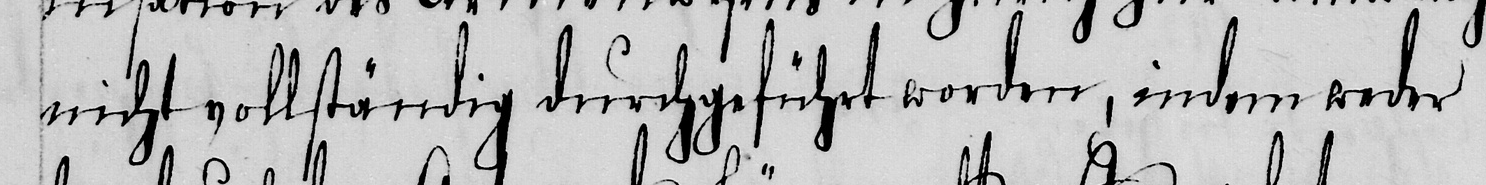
nicht vollständig durchgeführt worden, indem weder
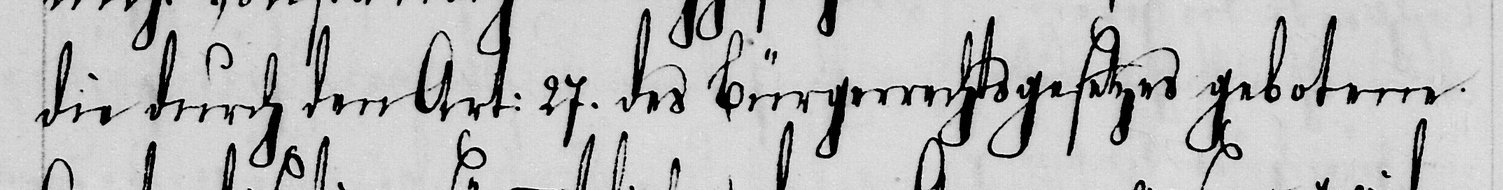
die durch den Art: 27. des Bürgerrechtsgesetzes gebotene
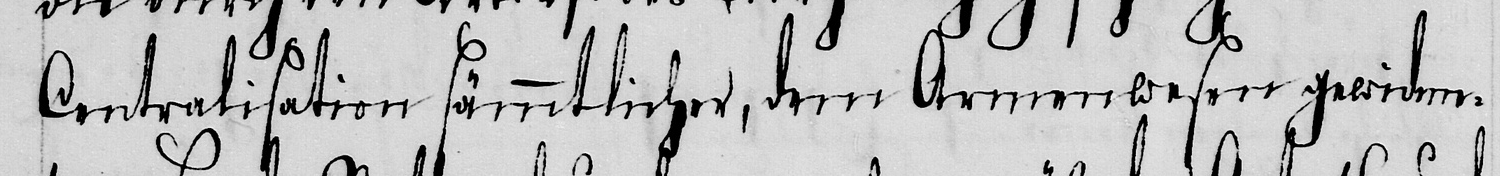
Centralisation sämmtlicher, dem Armenwesen gewidme¬
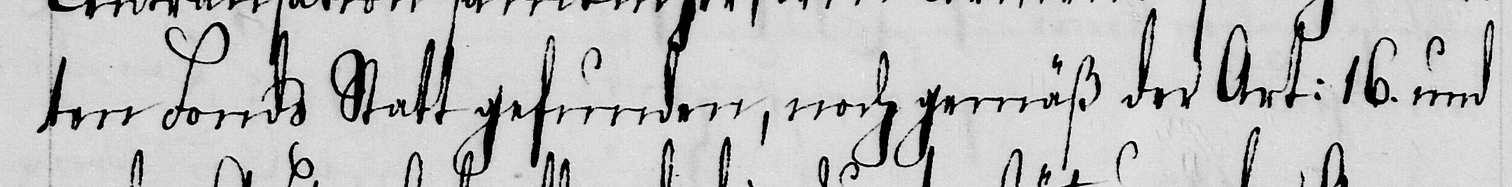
ten Fonds Statt gefunden, noch gemäß der Art: 16. und
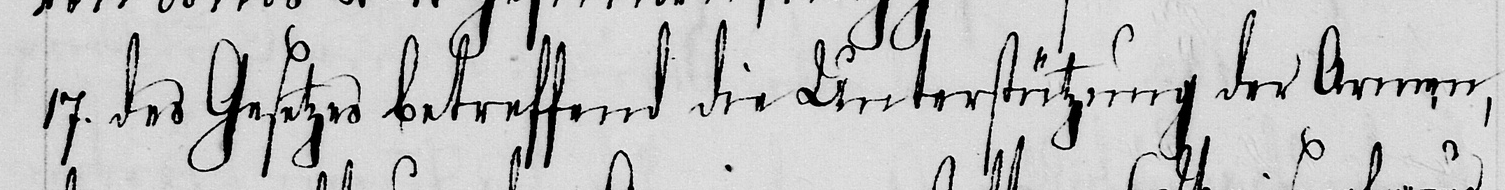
17. des Gesetzes betreffend die Unterstützung der Armen,
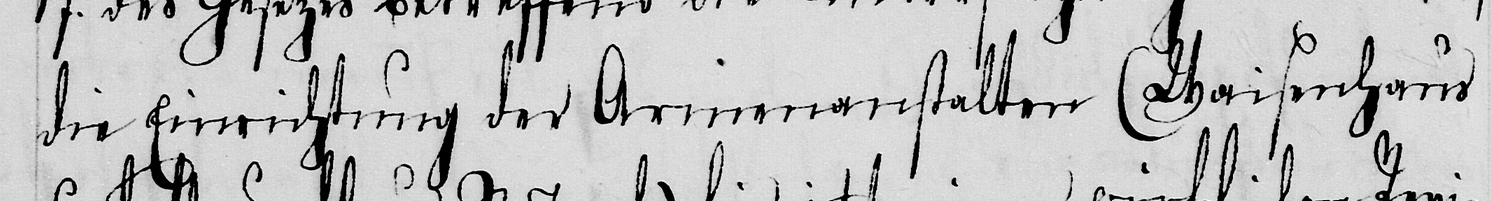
die Einrichtung der Armenanstalten (Waisenhaus
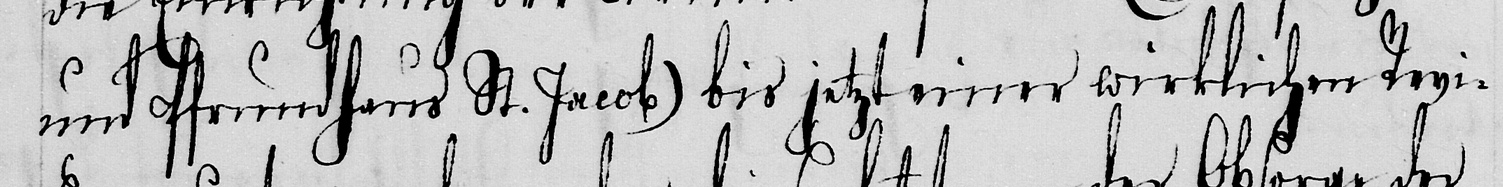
und Pfrundhaus St. Jacob) bis jetzt einer wirklichen Revi¬
